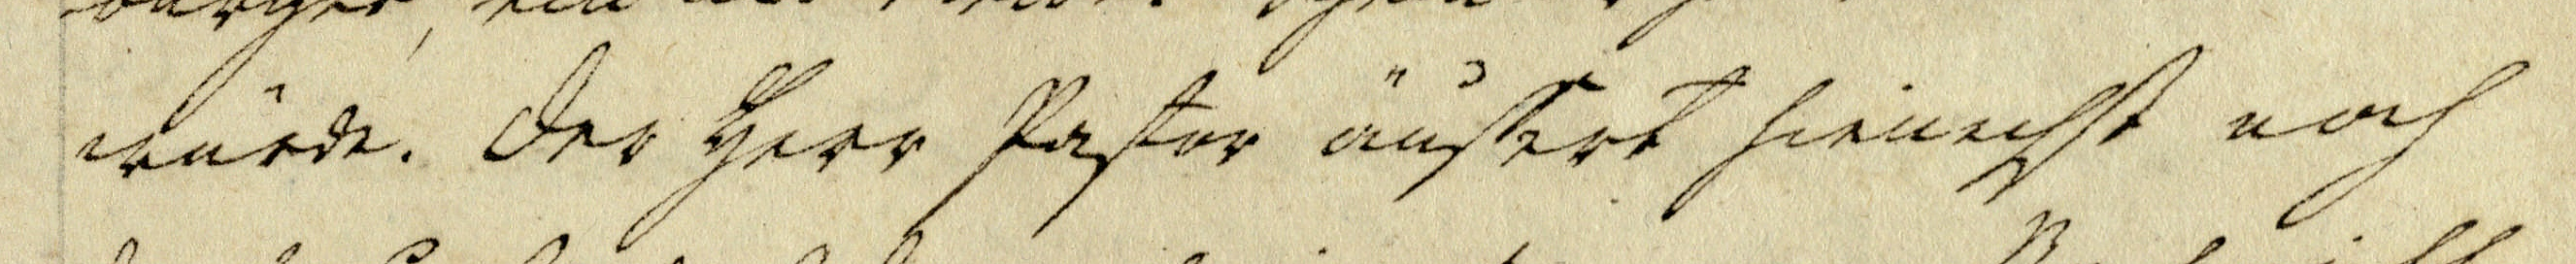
würde. Der Herr Pastor äussert hienechst noch
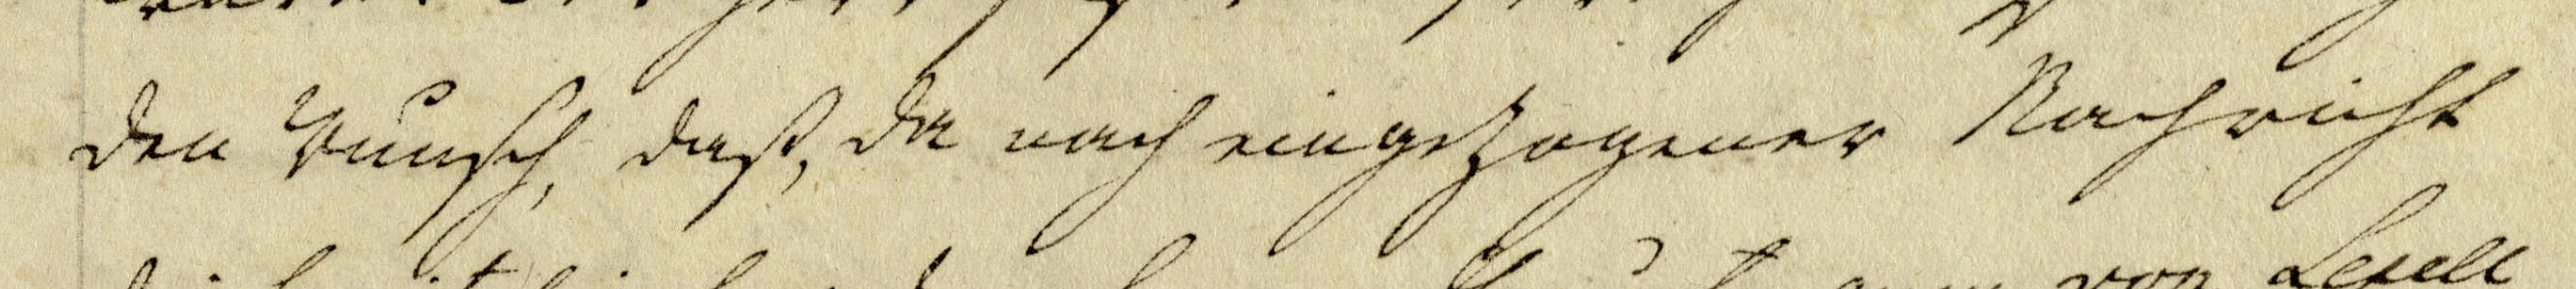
den Wunsch, daß, da nach eingezogener Nachricht
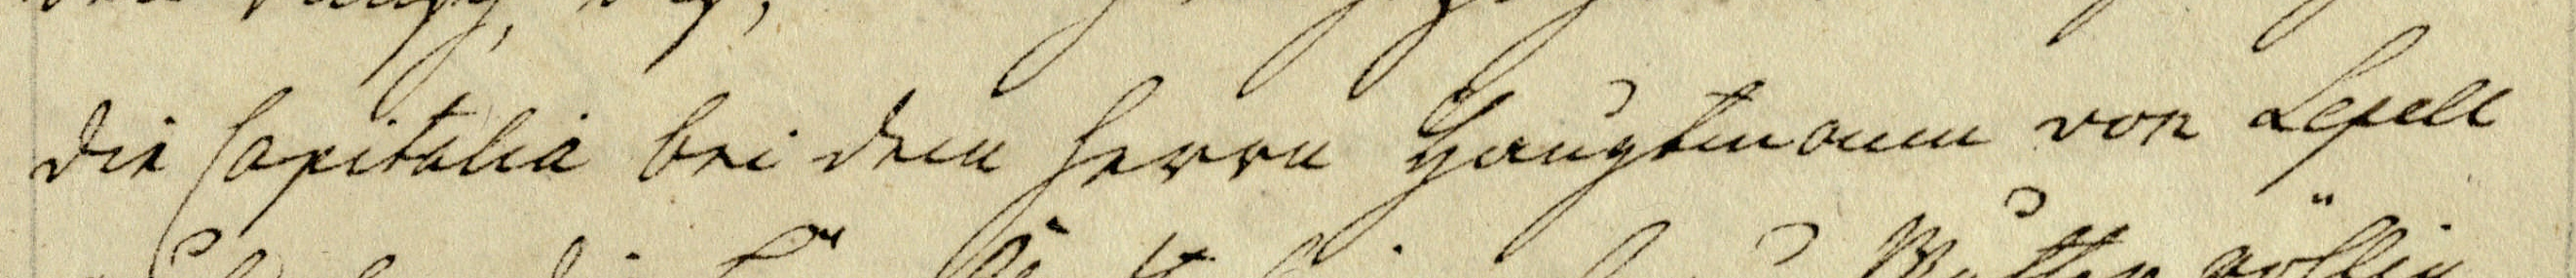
die Capitalia bei dem Herrn Hauptmann von Lepell
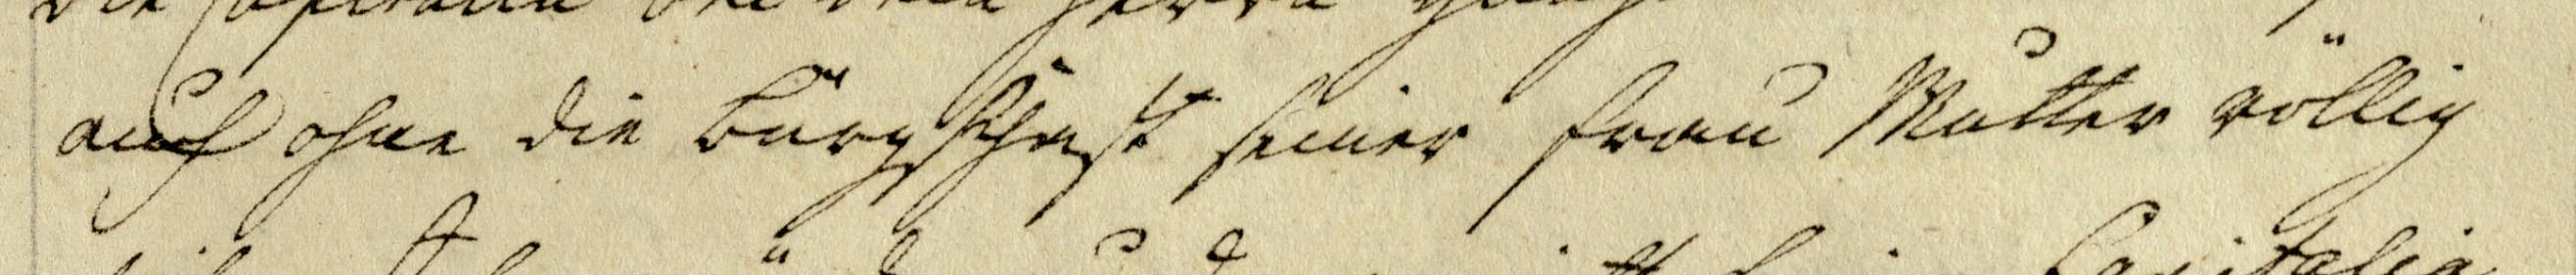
auch ohne die Bürgschaft seiner Frau Mutter völlig
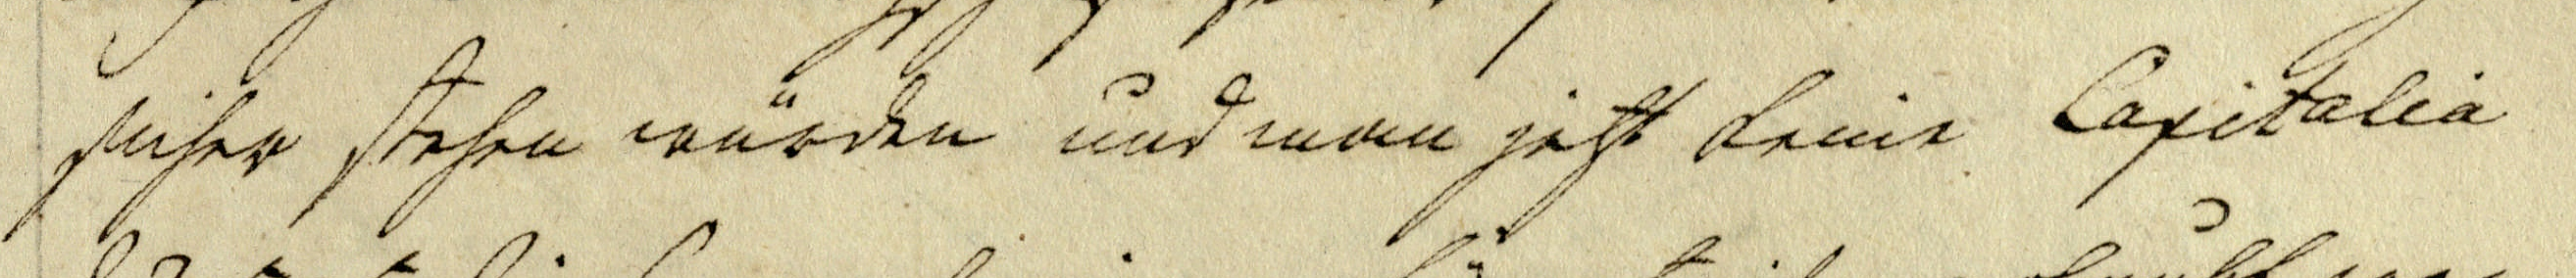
sicher stehen würden und man jetzt keine Capitalia
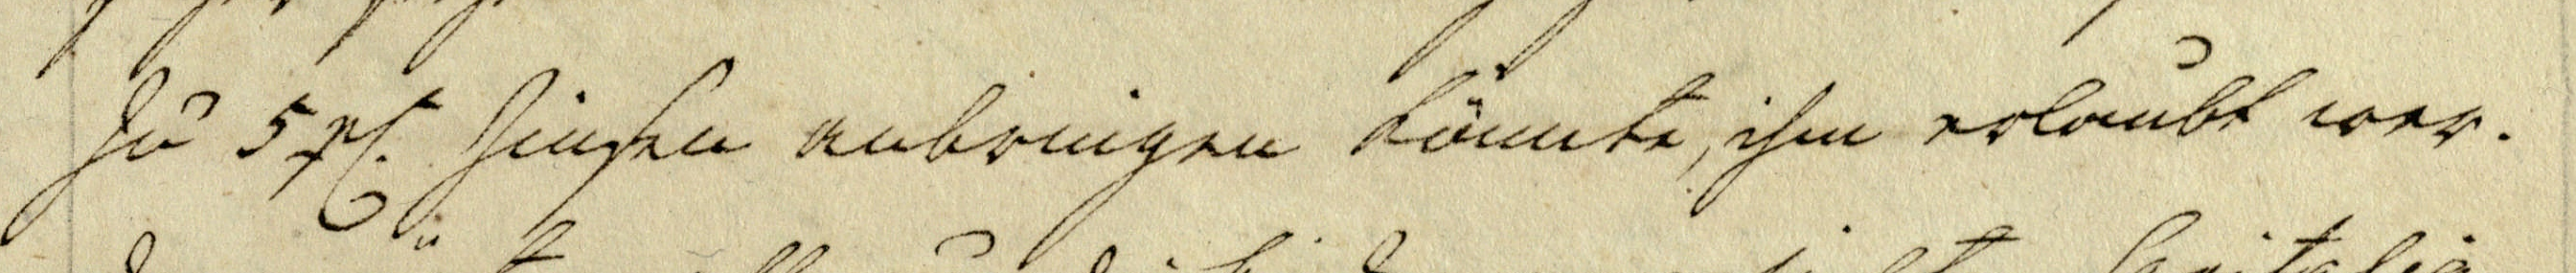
zu 5 pl. Zinsen anbringen könnte, ihm erlaubt wer¬
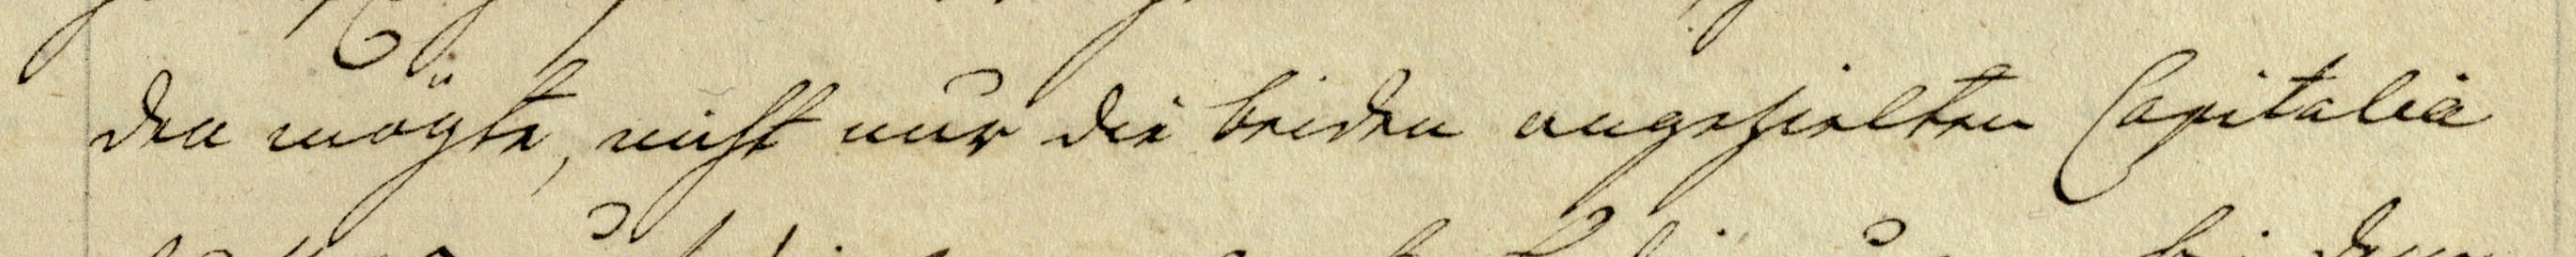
den mögte, nicht nur die beiden angezielten Capitalia
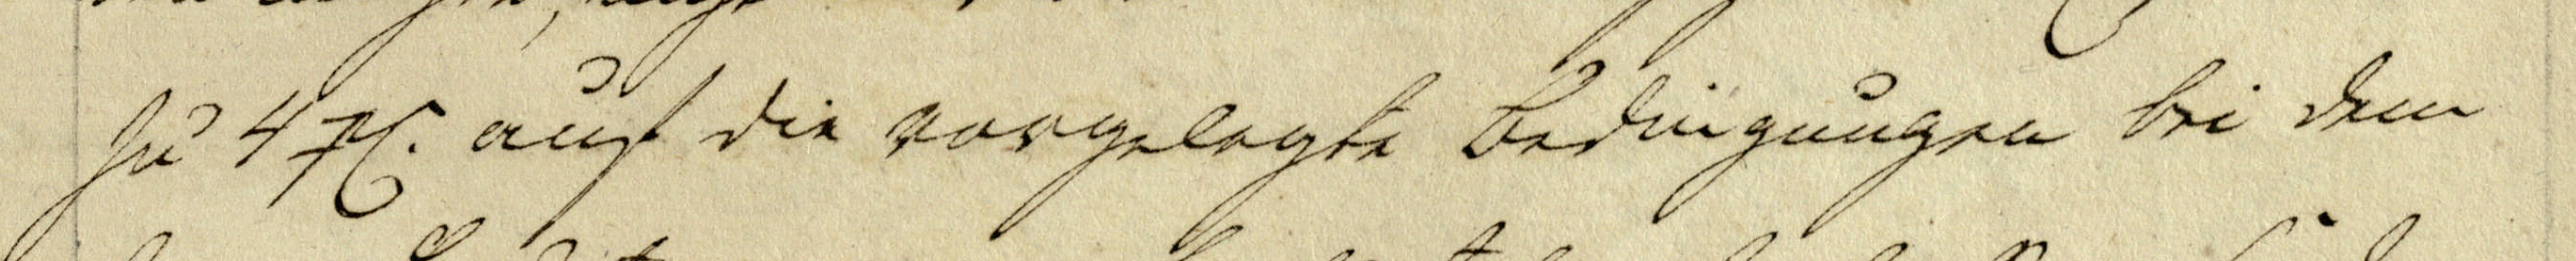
zu 4 pl. auf die vorgelegte Bedingungen bei dem
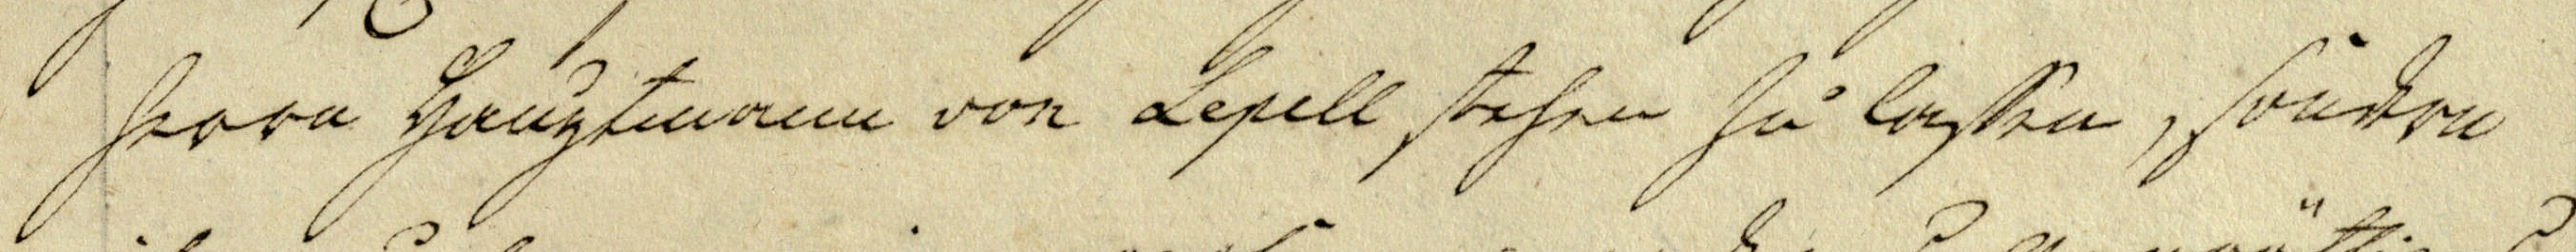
Herrn Hauptmann von Lepell stehen zu lassen, sondern
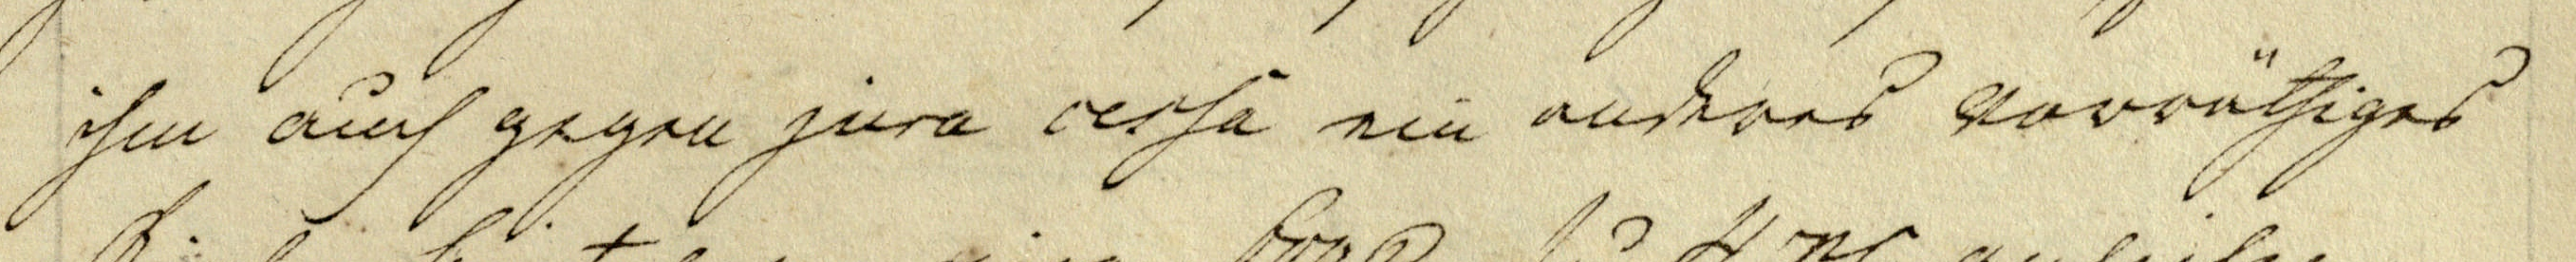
ihm auch gegen jura cessa ein anderes vorräthiges
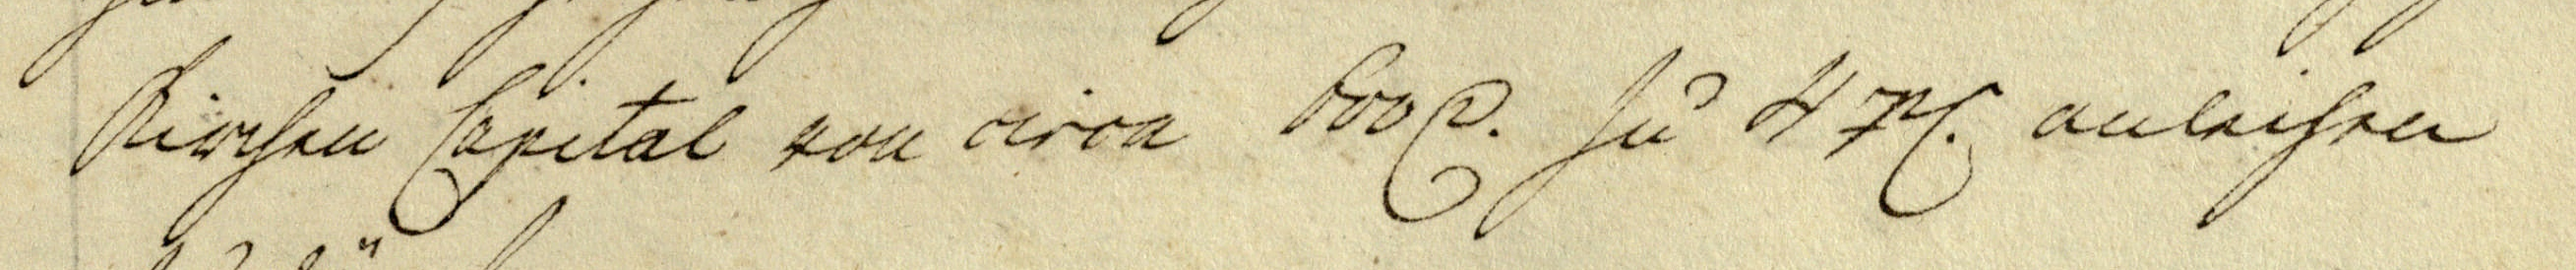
Kirchen Capital von circa 600 l. zu 4 pl., anleihen
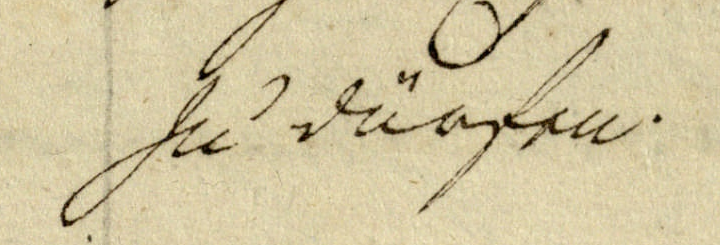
zu dürfen.
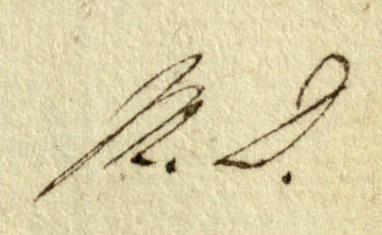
M. D.
